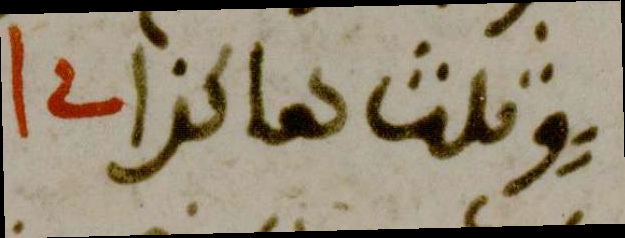12 وثلث هاكذا
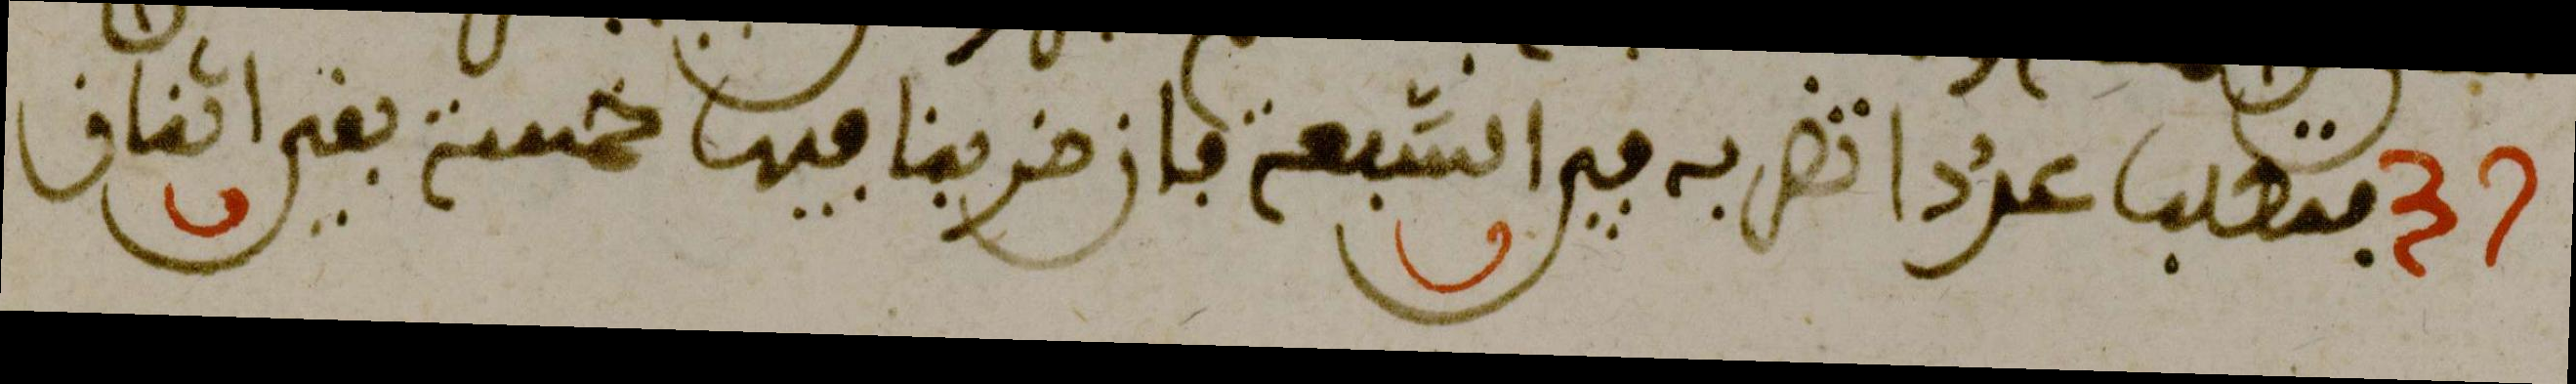37 فتطلب عدد اتضربه في السّبعة فان ضربنا فيها خمسة بقي اثنان
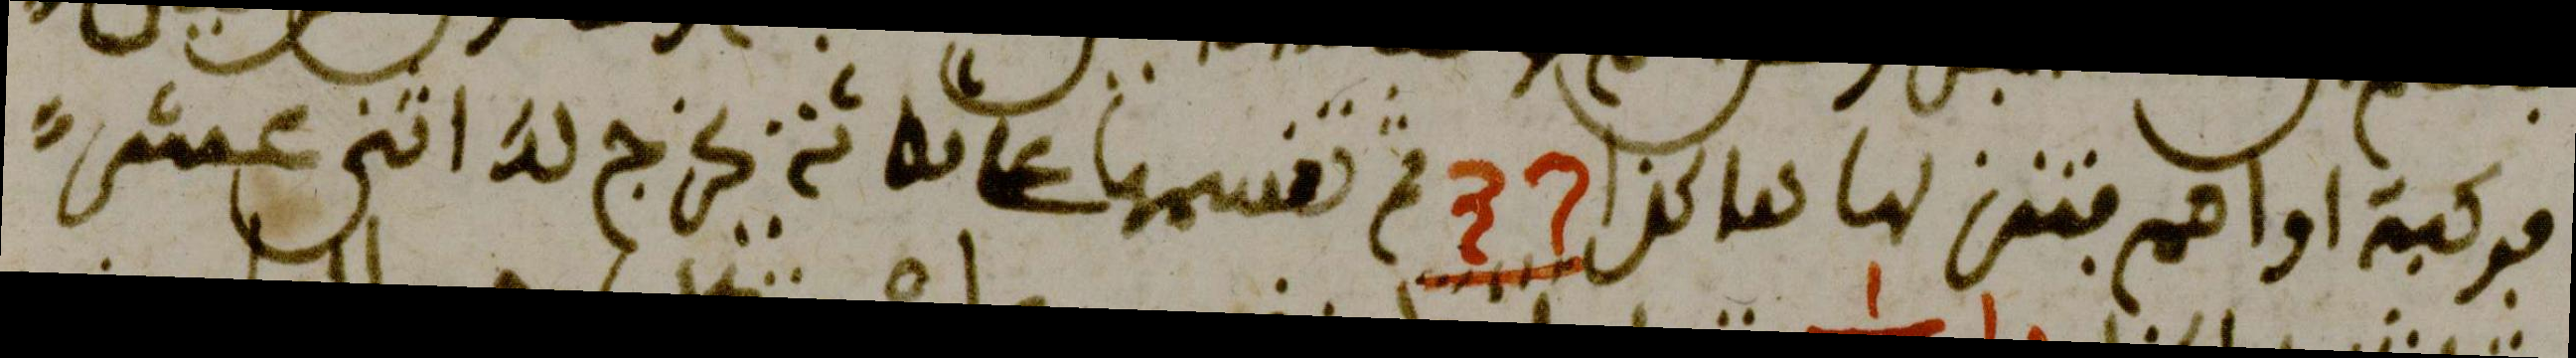مركبة او اصم فتنزلها هاكذا 37 ثم تقسمها على ثلاثة يخرج لك اثنى عشر
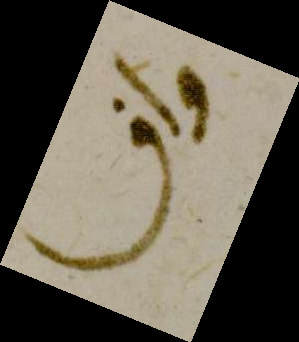وان
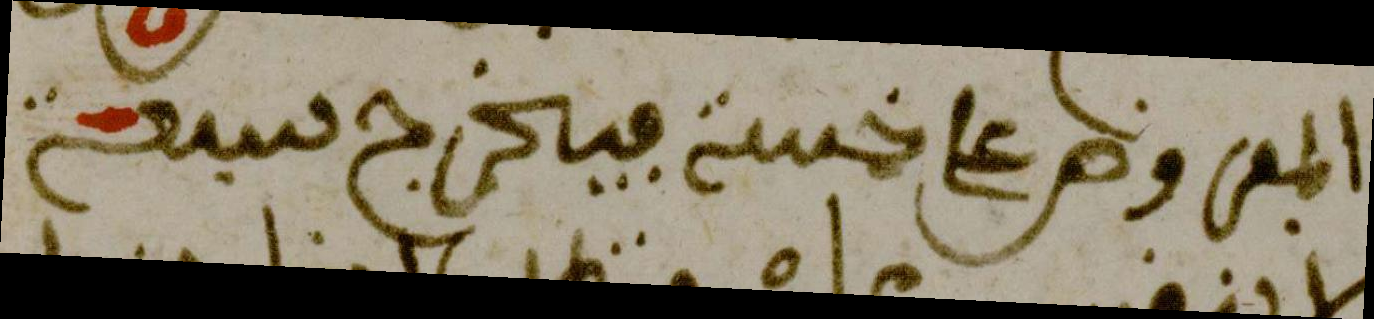المفروض على خمسة فيخرج سبعة
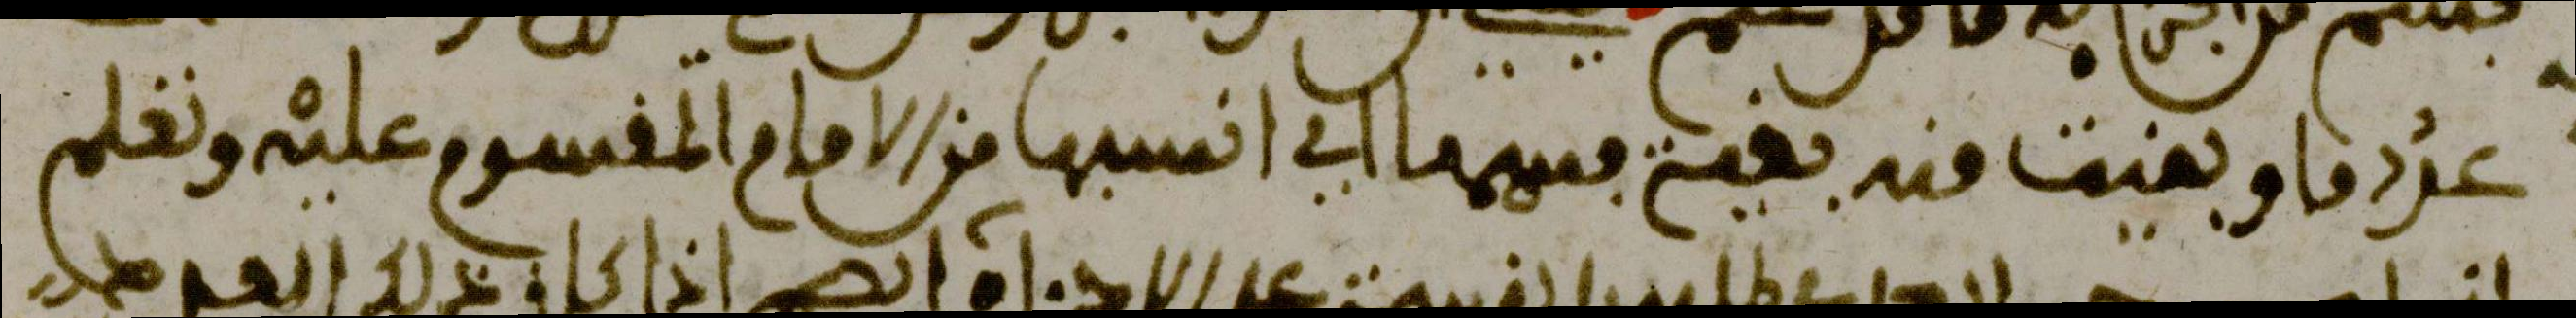عدد ما وبقيت منه بقية فسمهما اي انسبها من الامام المقسوم عليه وتعلم
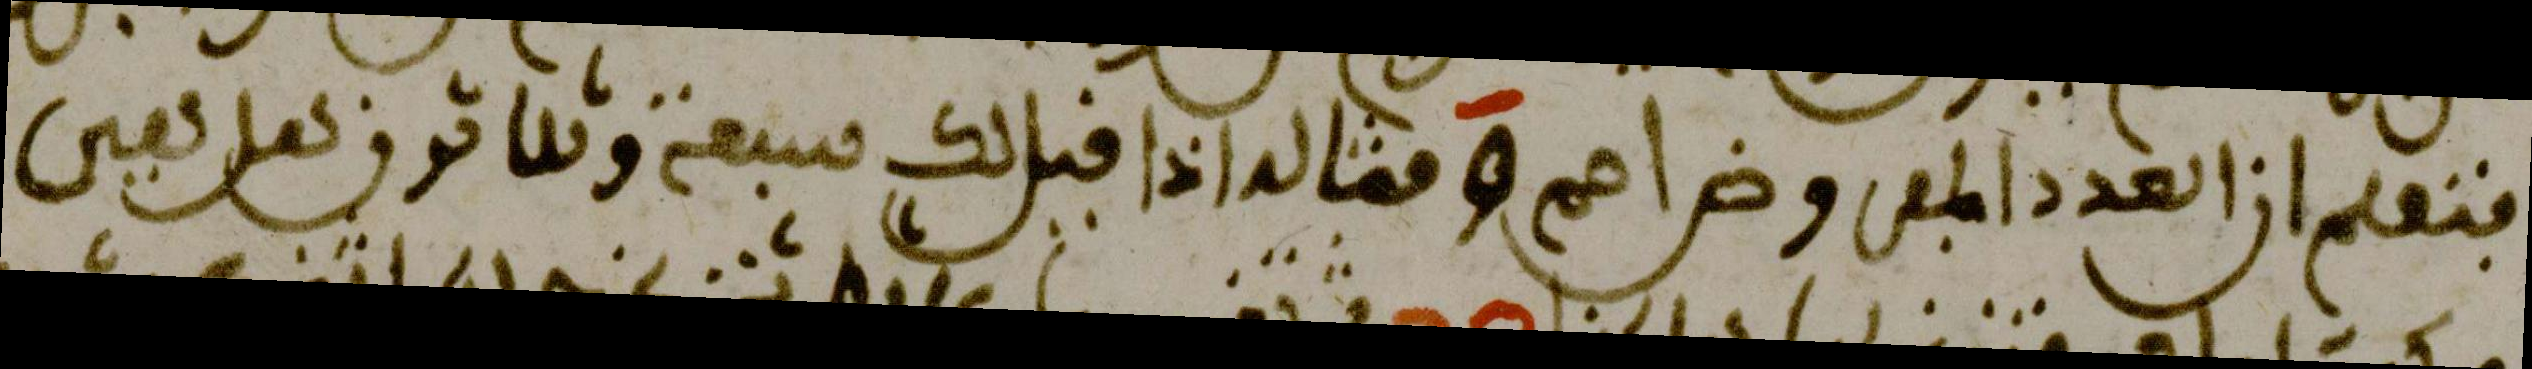فتعلم ان العدد المفروض اصم ومثاله اذا قيل لك سبعة وثلاثون هل هي
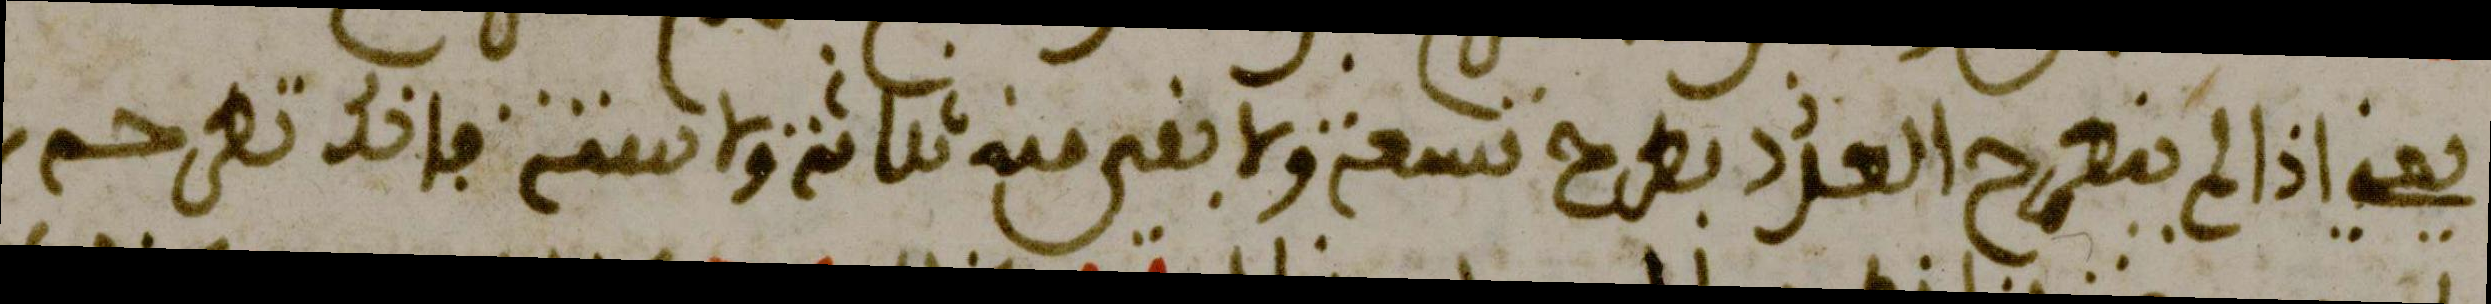يعني اذا لم ينطرح العدد بطرح تسعة ولا بقي منه ثلاثة ولا ستة فانك تطرحه
